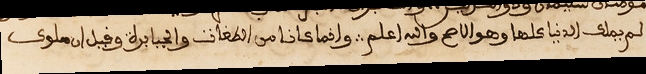لم يملك الدنيا كلها وهو الاصح والله اعلم وانما كانا من الطغات والجبابرة وقيل ان ملوك
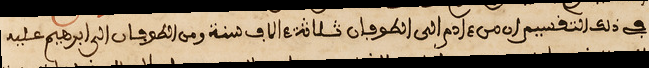في ذلك التقسيم ان من ءادم الى الطوفان ثلاثة ءالاف سنة ومن الطوفان الى ابرهيم عليه
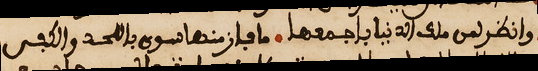وانظر لمن ملك الدنيا باجمعها ما فاز منها سوه باللحد والكفر
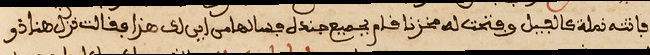فاتته نملة كالفيل وفتحت له مخزنا قال بجميع جنده فسالها من اين لك هذا فقالت نزل هنا ذو
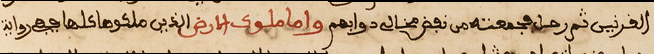القرنين ثم رحل فجمعته من نفض مخالى دوابهم واما ملوك الارض الذين ملكوها كلها فهي رواية
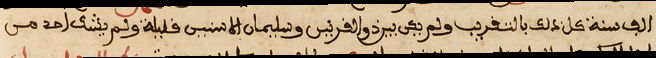الف سنة كل ذلك بالتقريب ولم يكن بين ذو القرنين وسليمان الا سنين قليلة ولم يشك احد من
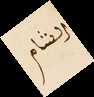الشام
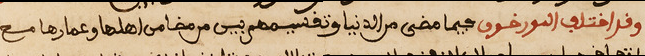وقد اختلف المورخون فيما مضى من الدينا وتقسيمهمى بين من مضا من اهلها وعمارها مع
